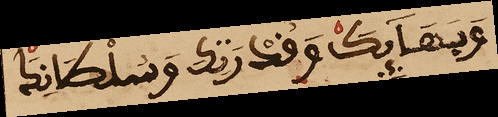وبهائك وقدرتك وسلطانك
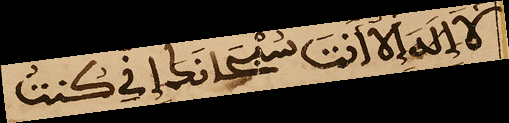لا إله إلا أنت سبحانك إنه كنت
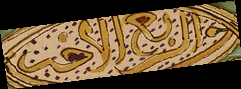من الربع الاخر
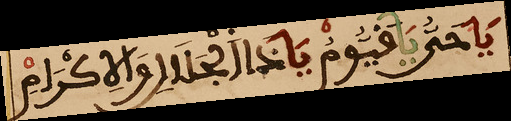يا حى يا قيوم يا ذا الجلال و الاكرام
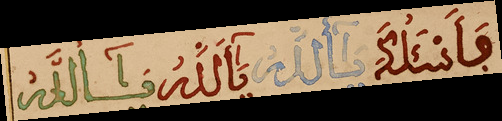فأسألك يا الله يا الله يا الله
